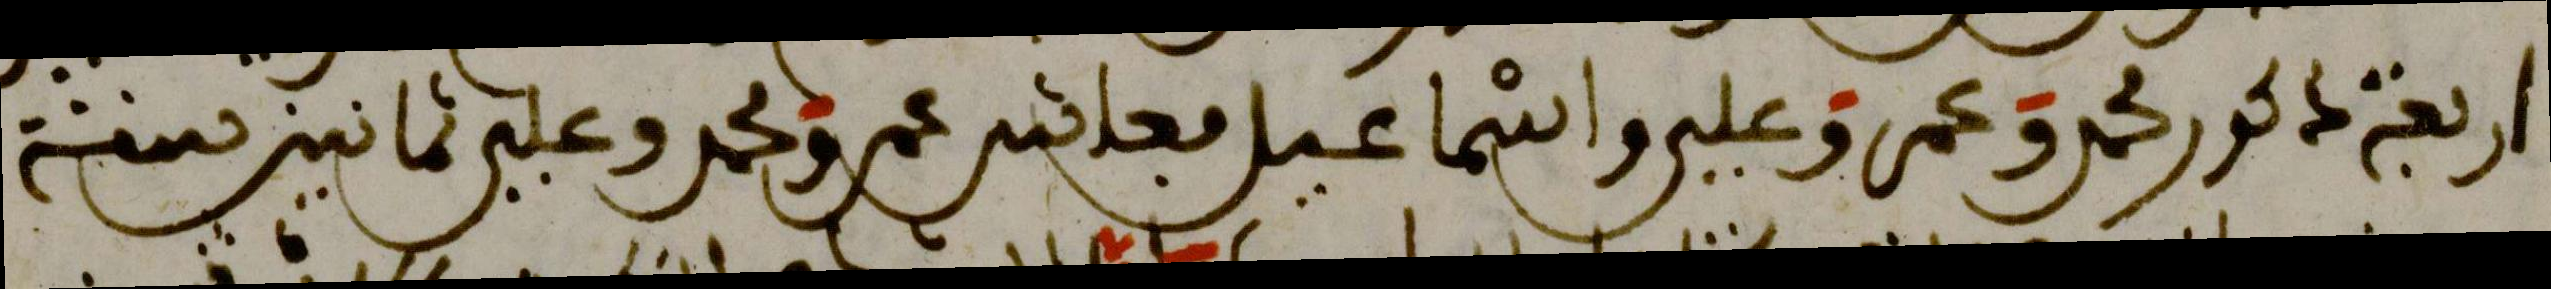اربعة ذكور محمد و عمر و علي و اسماعيل فعاشر عمر و محمد و علي ثمانين سنة
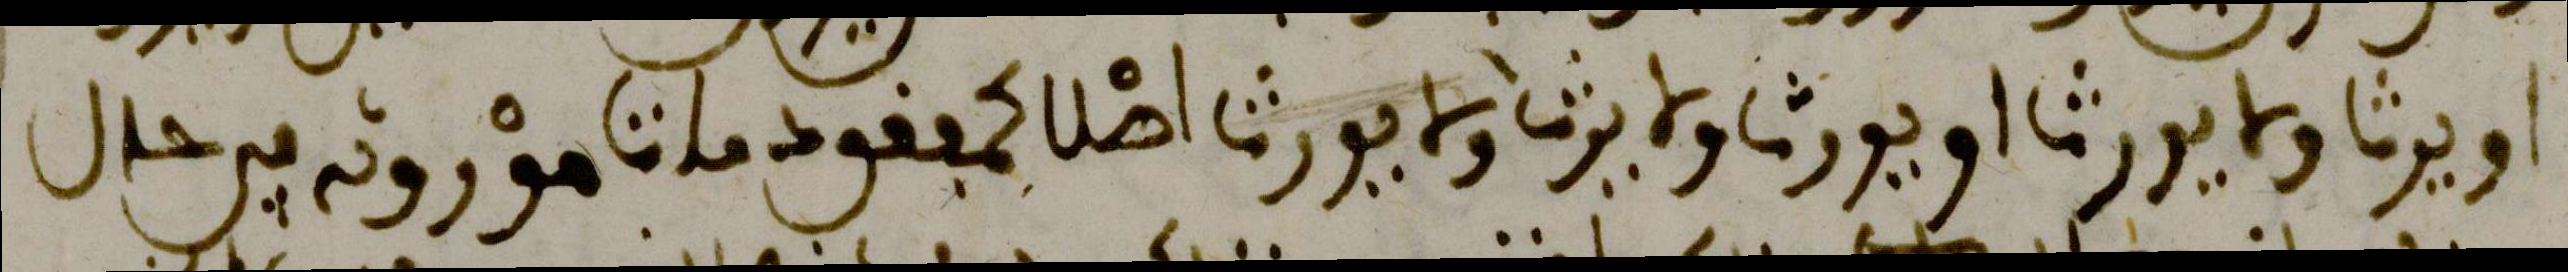او يرث و لا يورث او يورث لا يرث ولا يورث اصلا كمفقود مات موروثه في حال
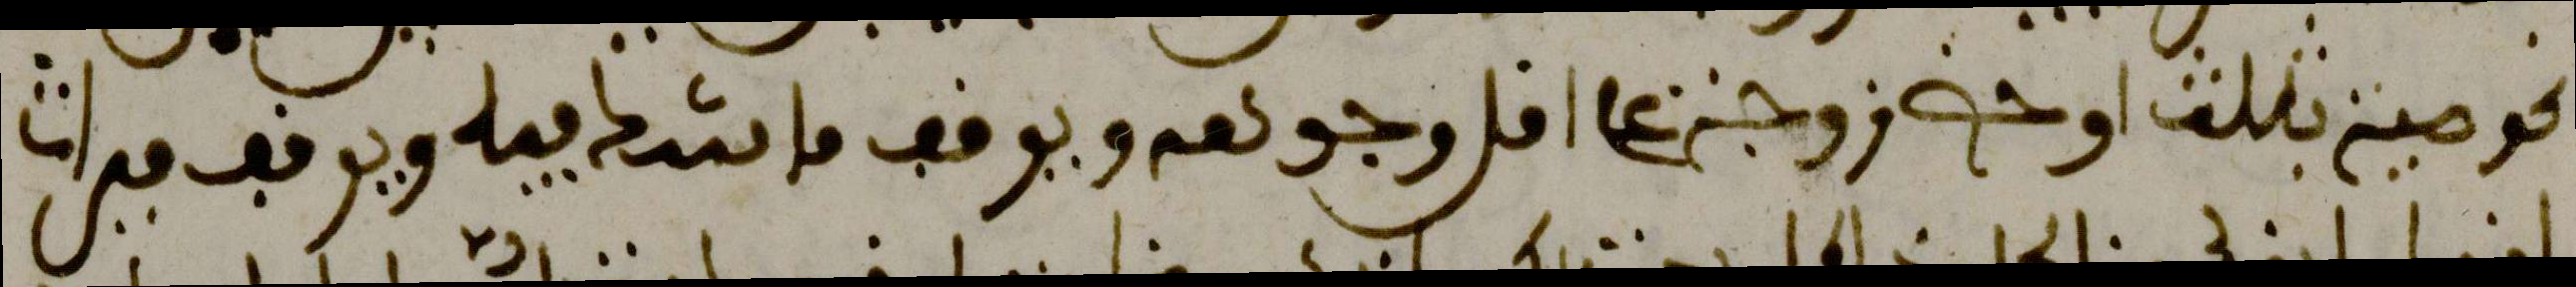كوصية بثلث اوحض زوجة على اقل وجوهه و يوقف ما شك فيه و يوقف ميراث
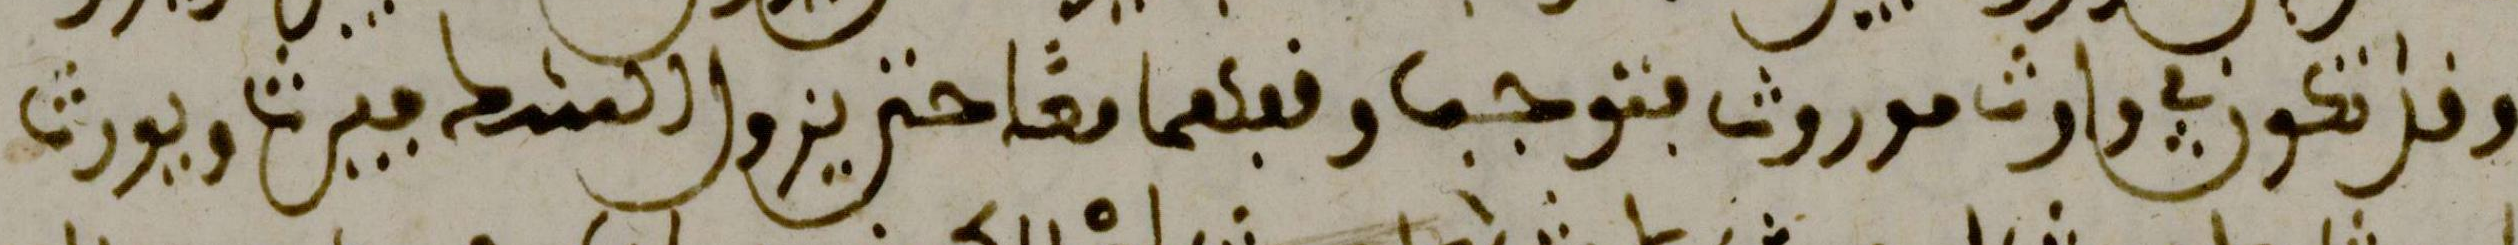و قد تكون في وارث موروث فتوجب و قفهما معا حتى يزول الشك فيرث و يورث
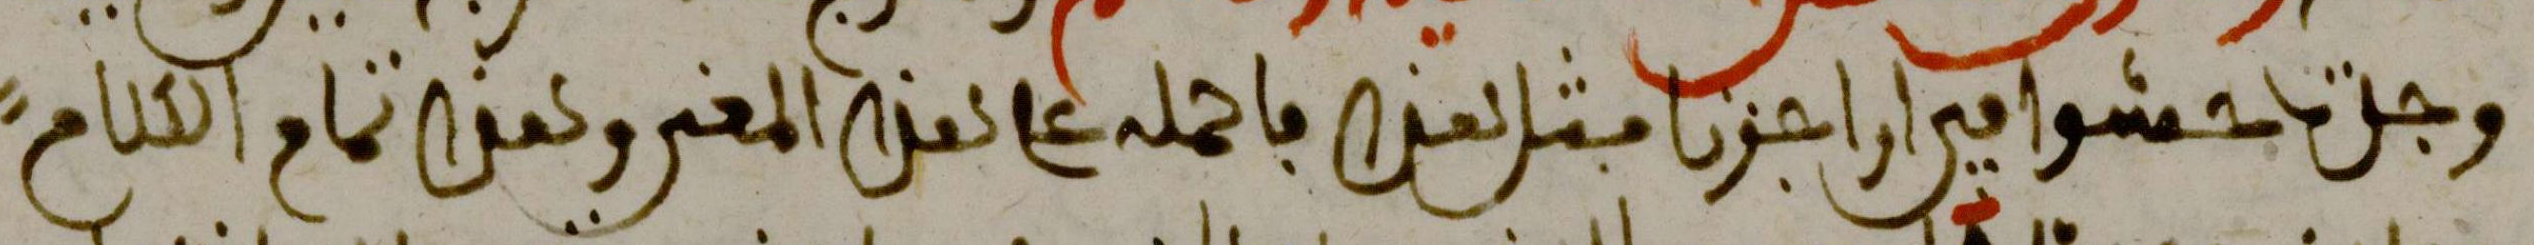وجدت حشوا في اراجزنا مثل هذا فاحمله على هذا المعني و هذا تمام الكلام
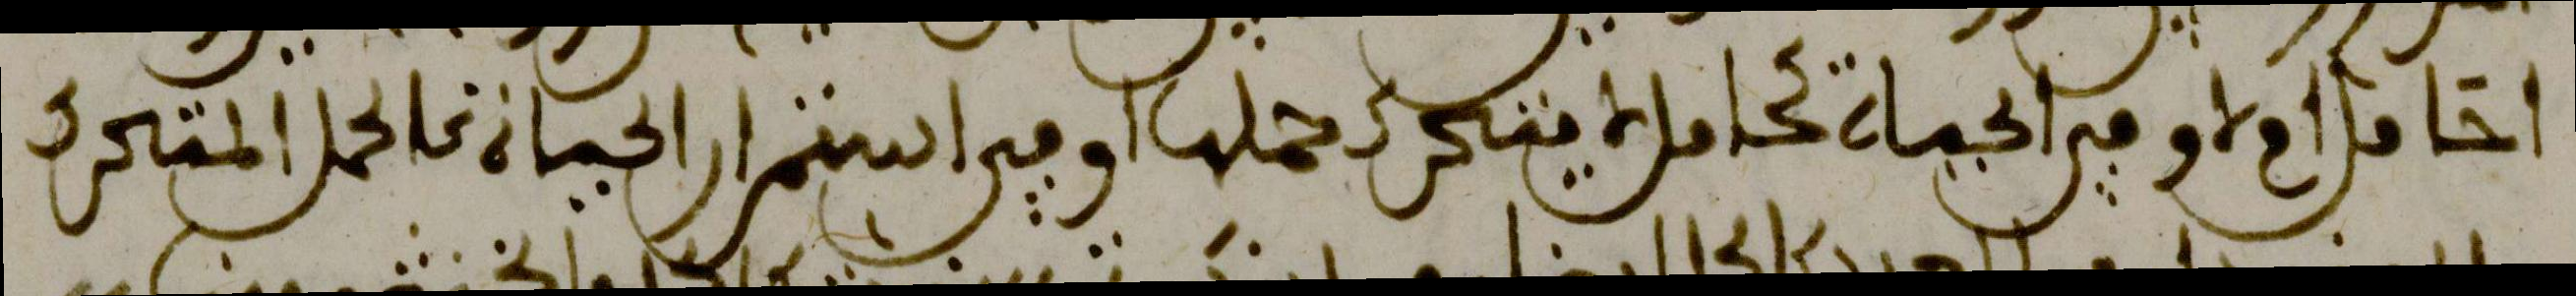احامل ام لا و في الحياة كحامل لا يتحرك حملها او في استمرار الحياة كالحمل المتحرك
